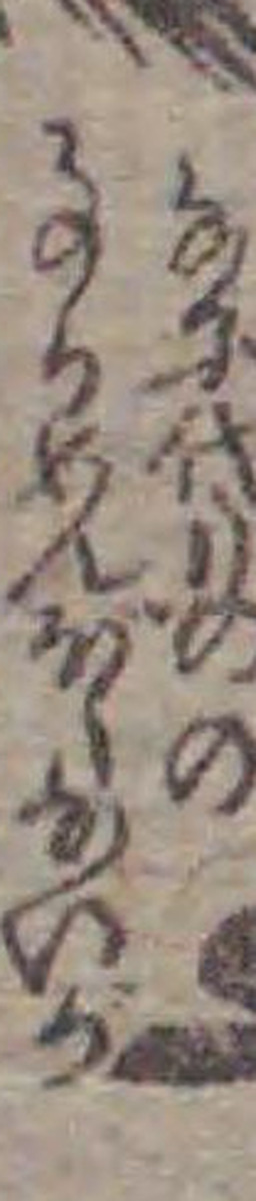事かめんほくないが
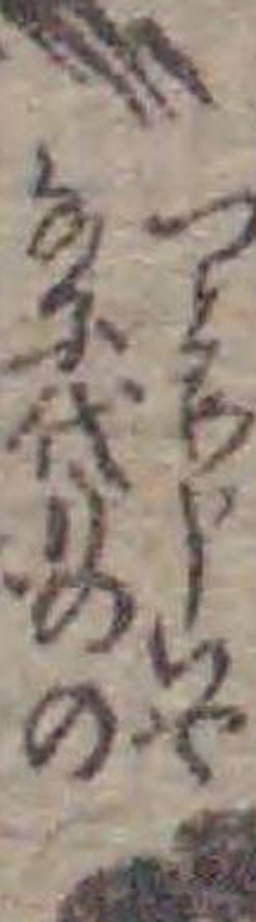なに代ものの
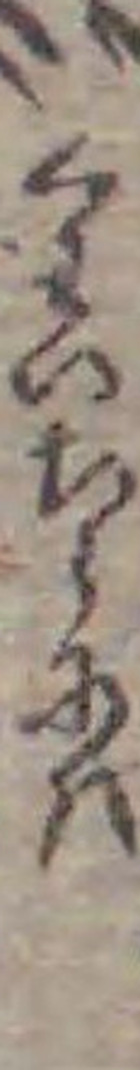くわいちうには
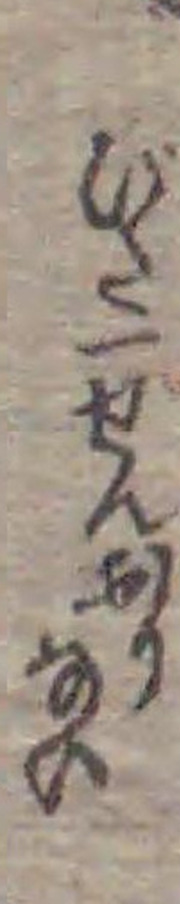びた一せんおりない

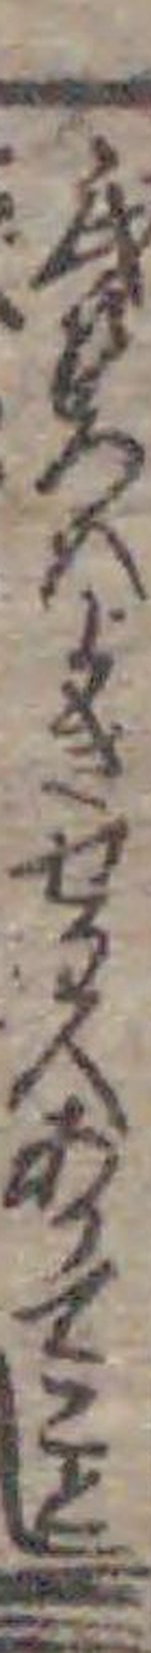武左衛門はよきせわ人ありてことし
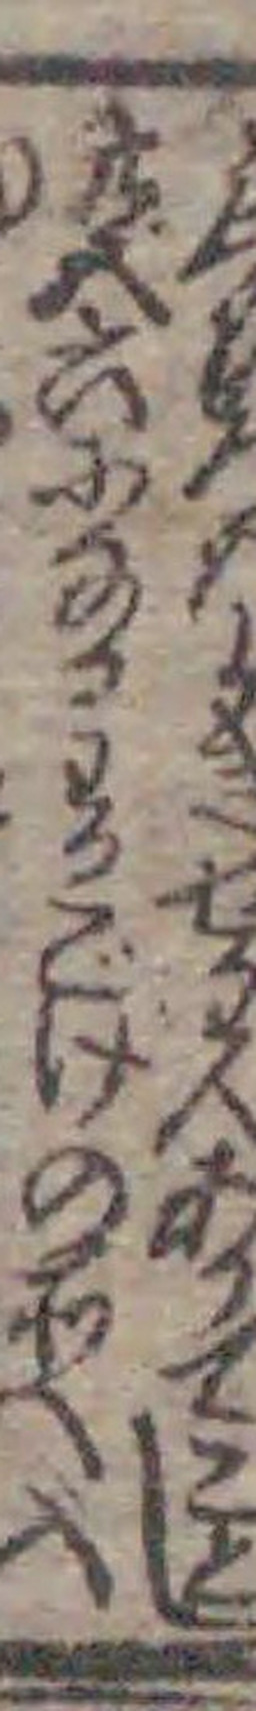廿五六になるわかごけの所へ入
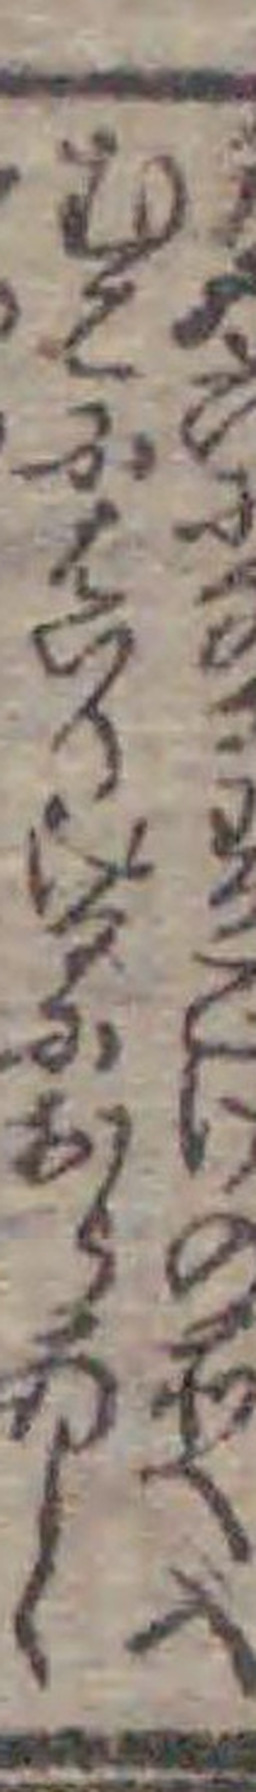むこにはいりけるにおりあしく
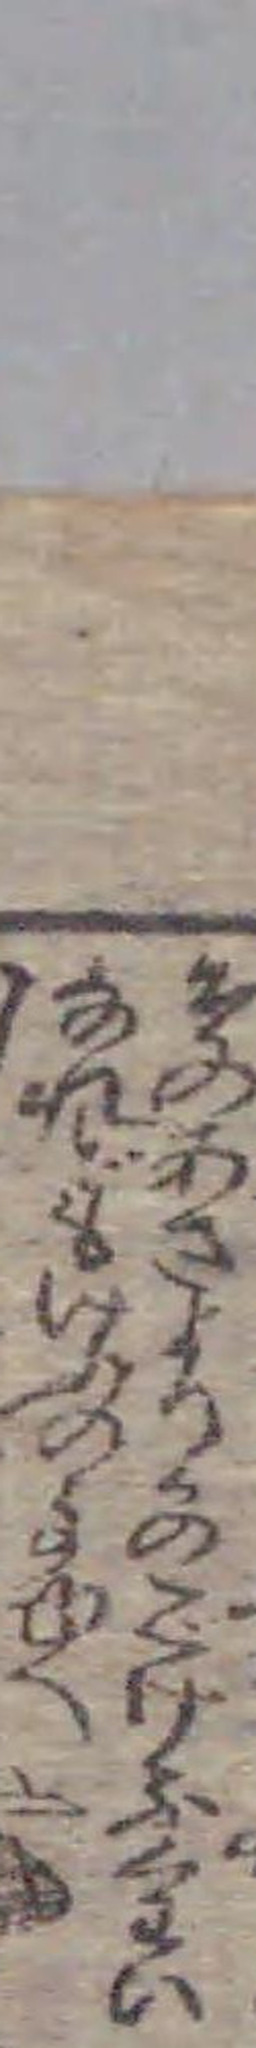なれどもけふの事ゆへ
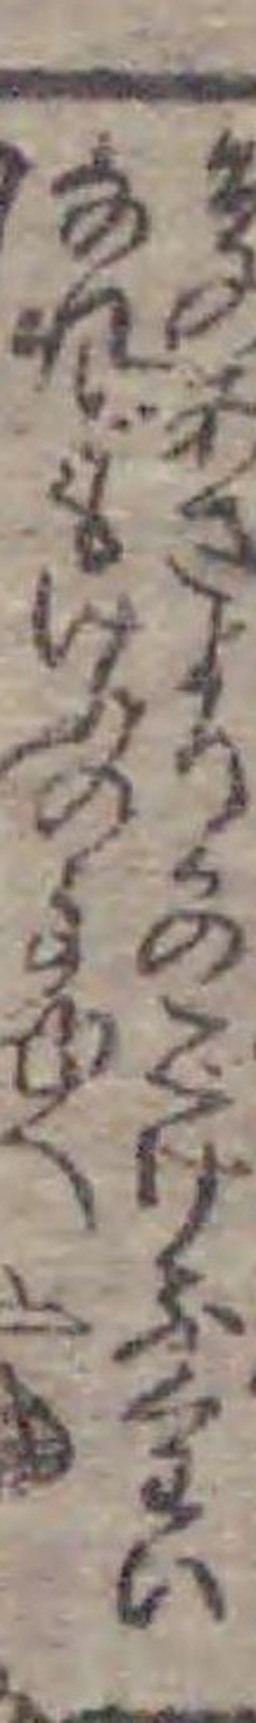なれどもけふの事ゆへ
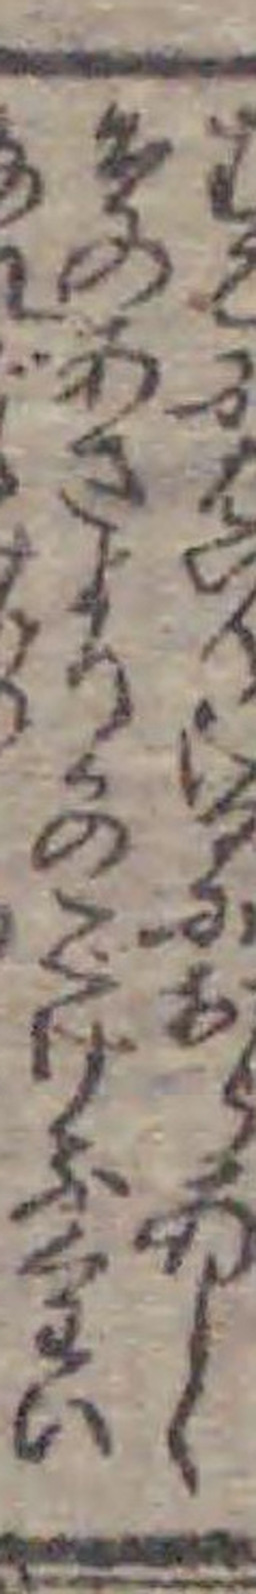そのあさよりかのごけふくわい
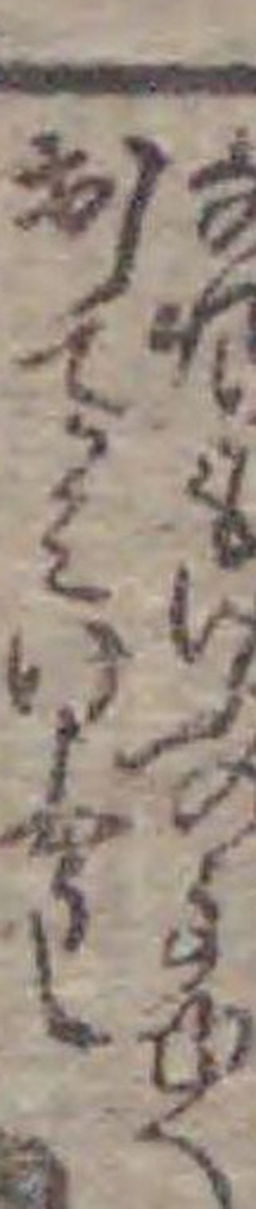おしてかみけしやうし
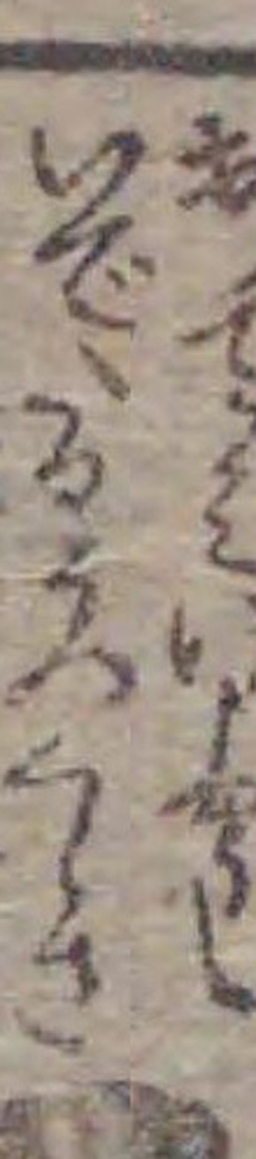いでたるうつくしさ
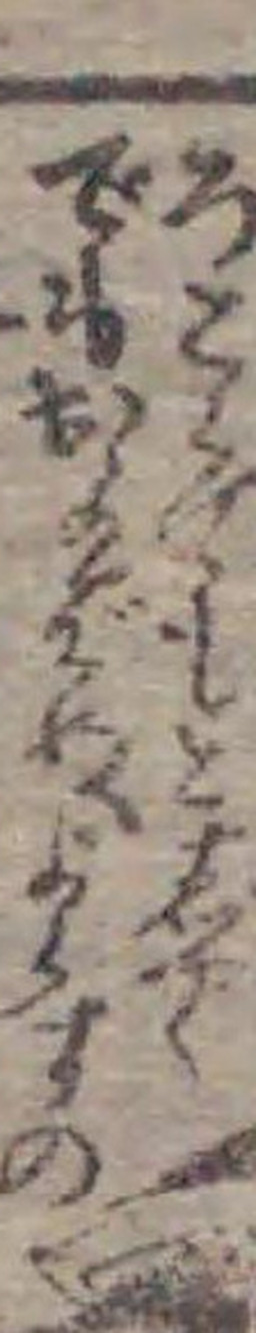でもおよばぬようすの
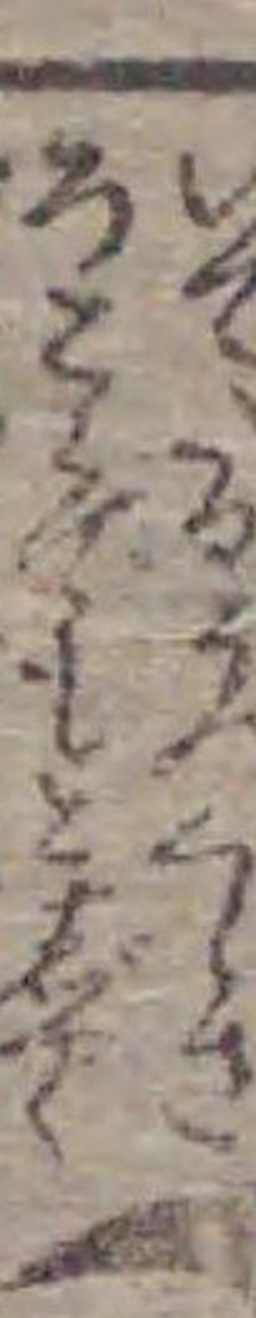ろこうでもとじやく
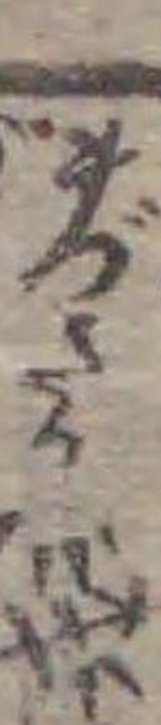まづさか
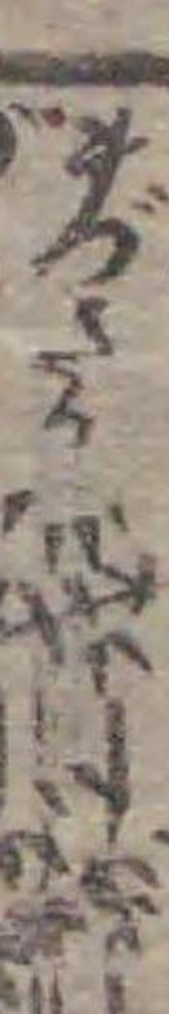まづさか
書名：見徳一炊夢 : 3巻
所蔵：国立国会図書館 National Diet Library, JAPAN
